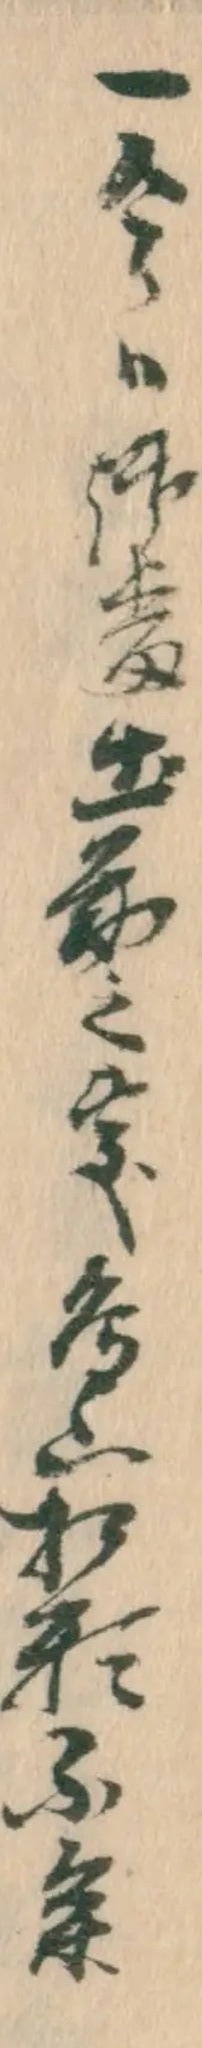一今日御番出勤之処鳥山相頼不参
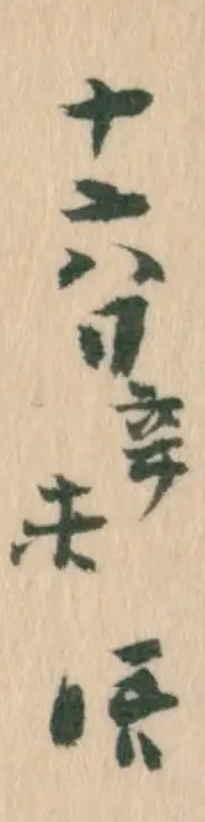十六日辛未晴

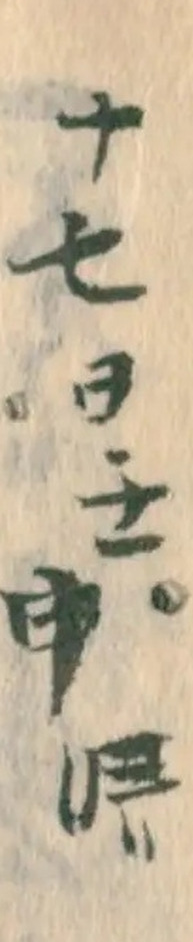十七日壬申晴
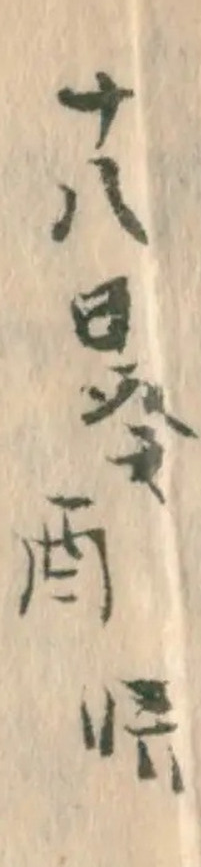十八日癸酉晴
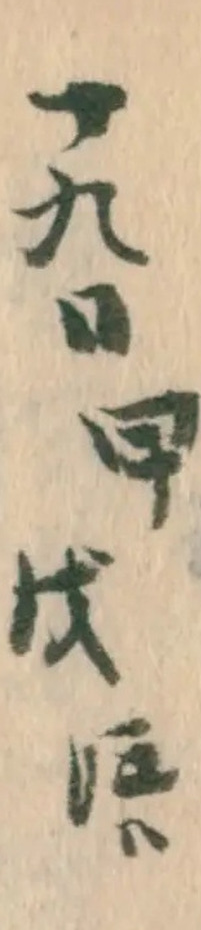十九日甲戌晴
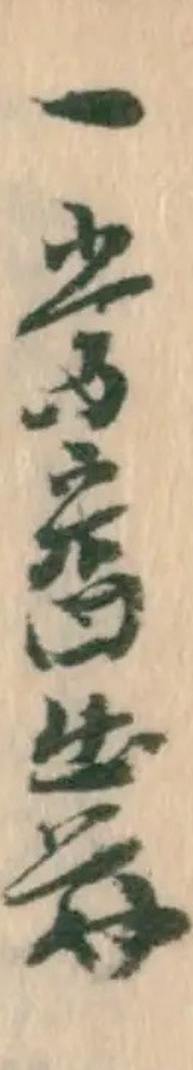一当番出勤
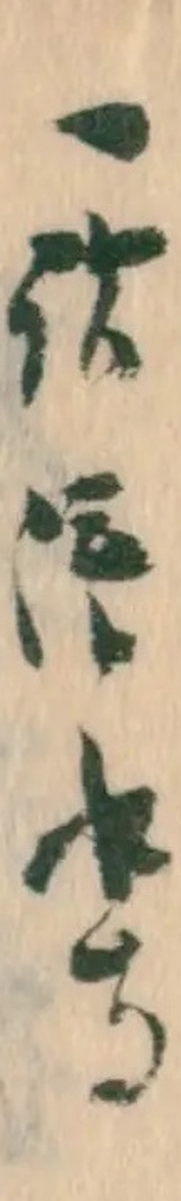一詣清水寺
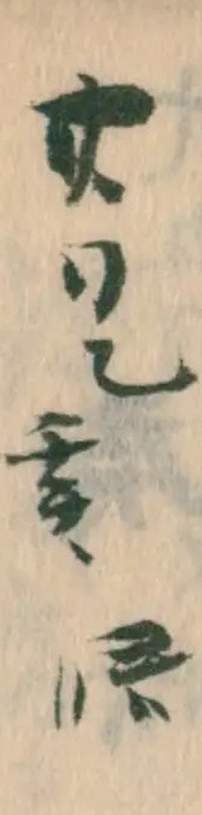廿日乙亥晴
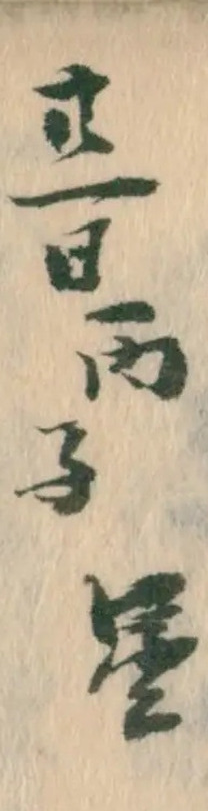廿一日丙子曇
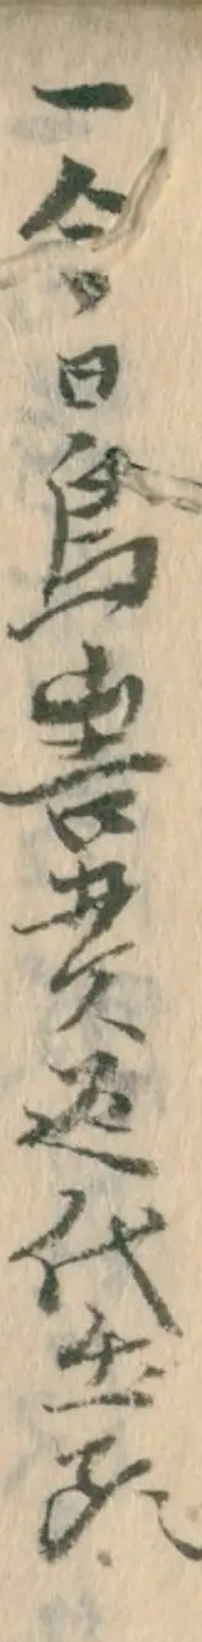一今日鳥山吉貫返代出頭

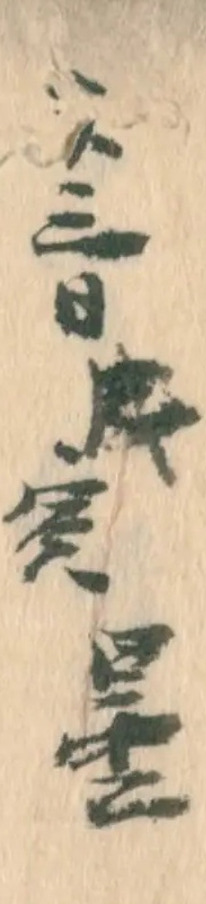廿三日戊寅曇
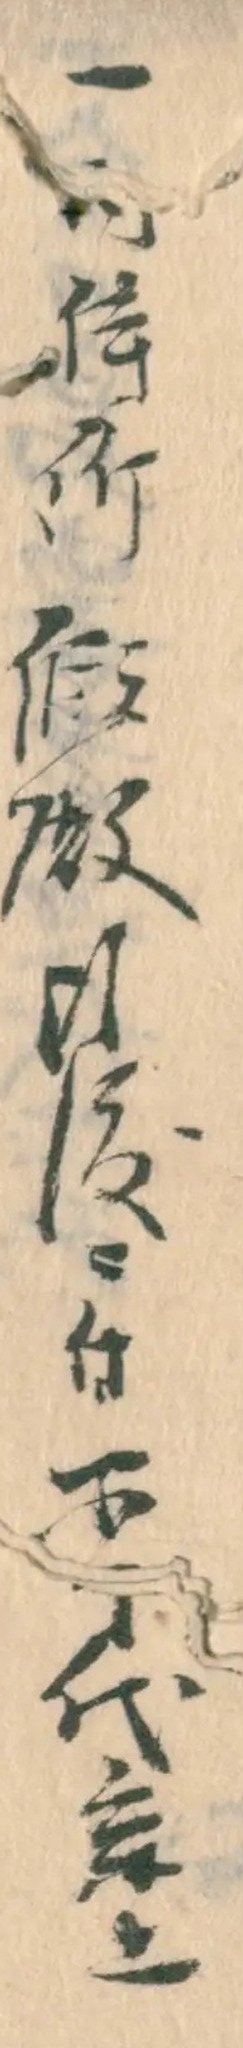一内侍所仮殿引渡ニ付所司代参上
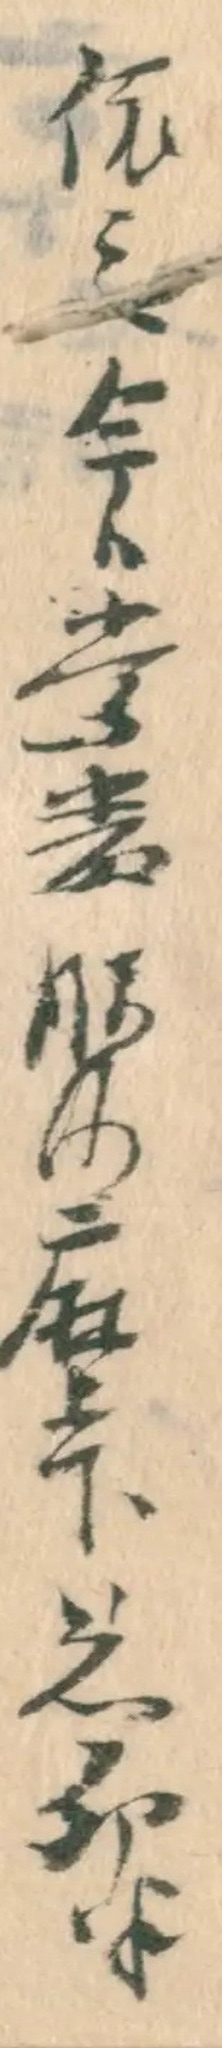依之今日当番服麻上下着卯半
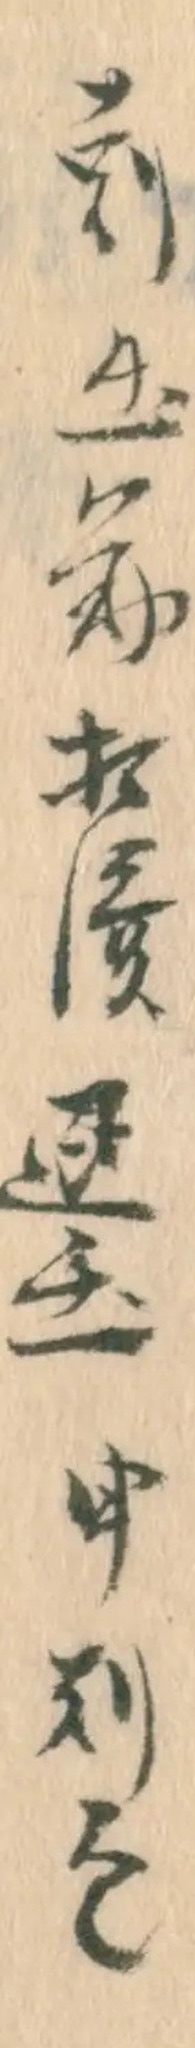刻出勤相済退出申刻過
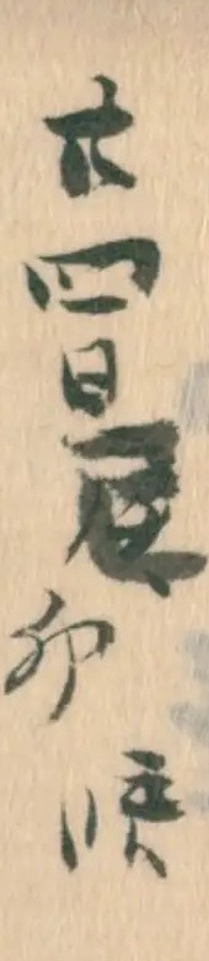廿四日己卯晴
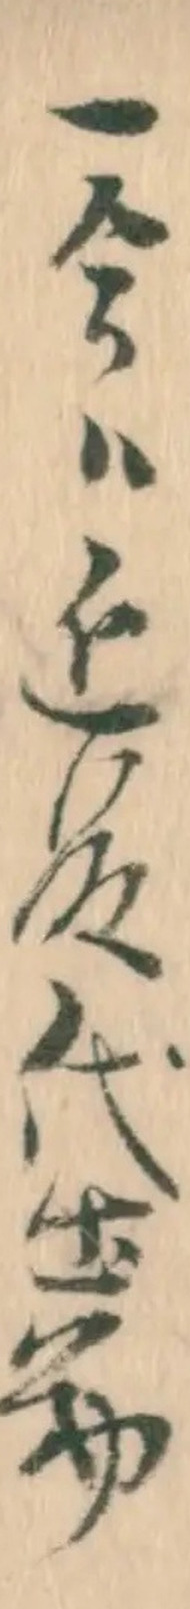一今日近藤代出勤
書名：禁裏御所御用日記. [131]
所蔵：国立国会図書館 National Diet Library, JAPAN
